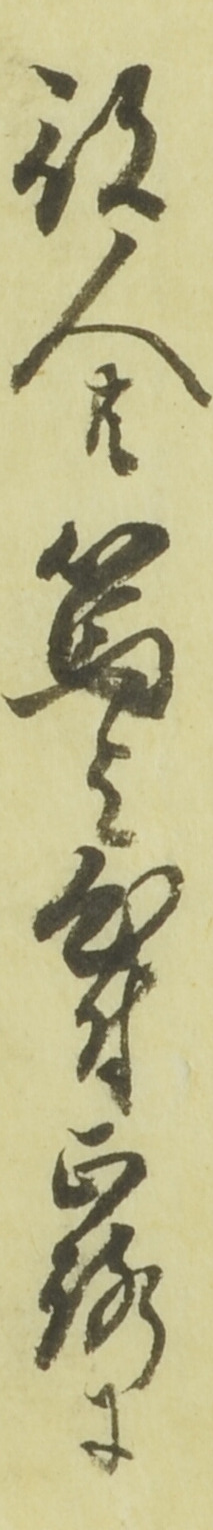役人共篤と心付正路に
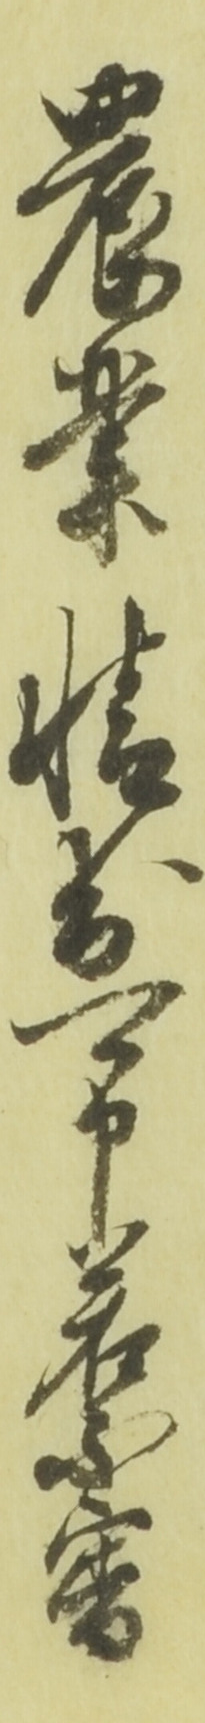農業精出可申若不審
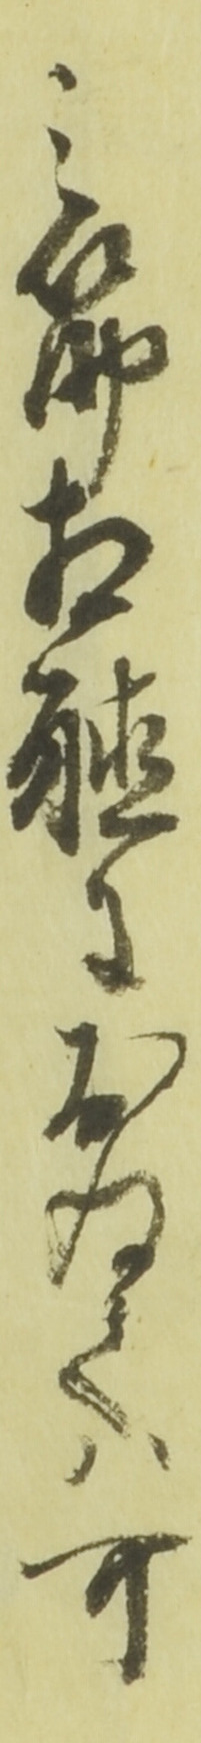之筋相聴におゐてハ可
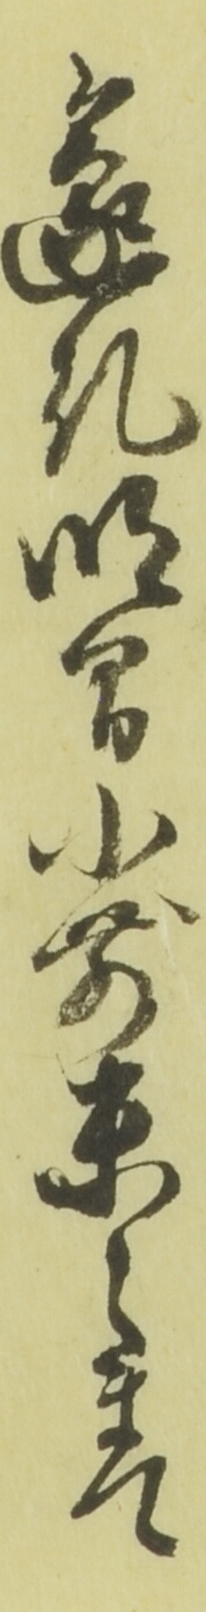遂糺明間小前末々まて
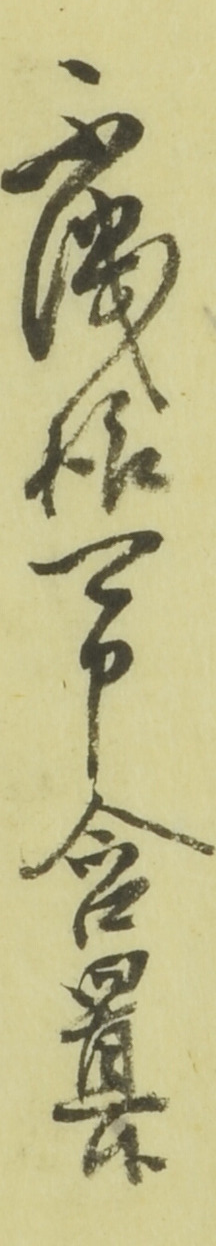不洩様可申含置候
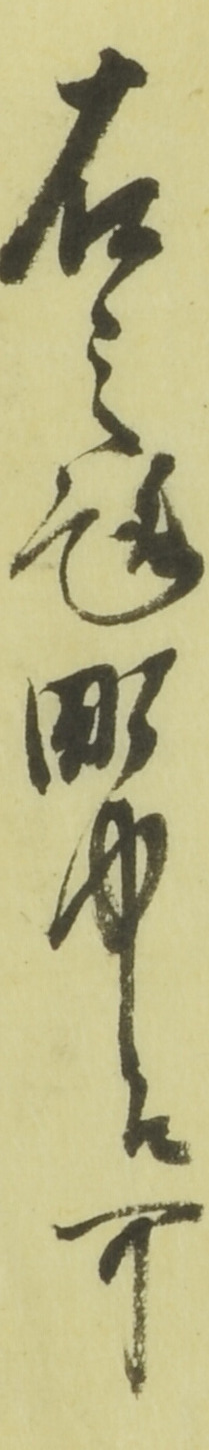右之趣町中江可
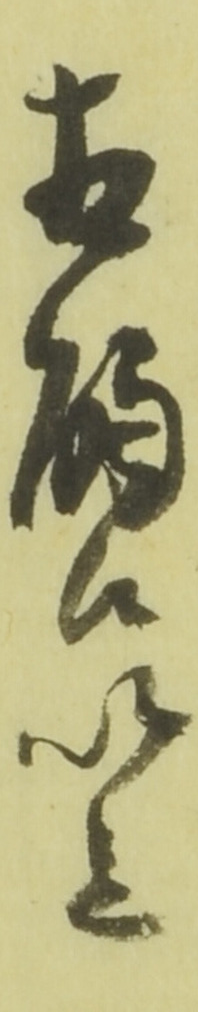相触候以上

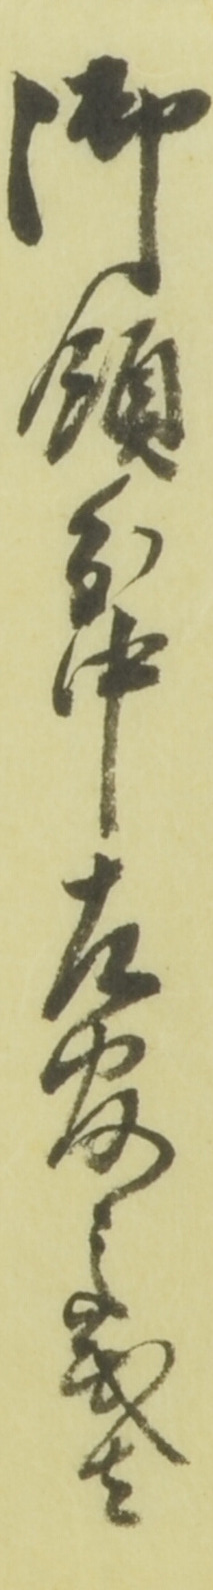御領分中左官之義は
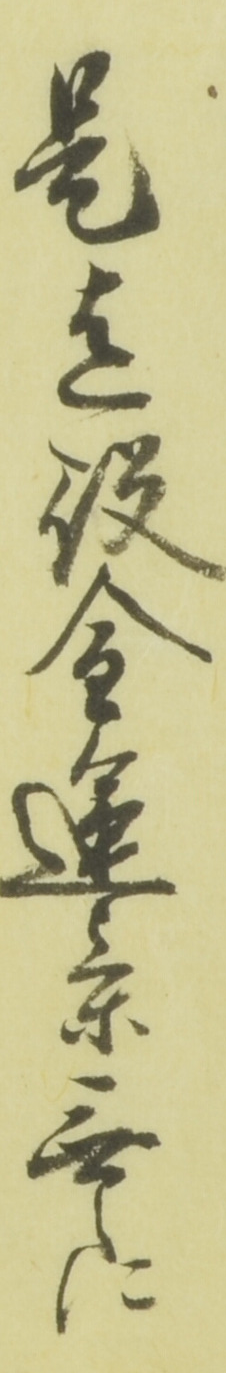是迄役金運上等無之に
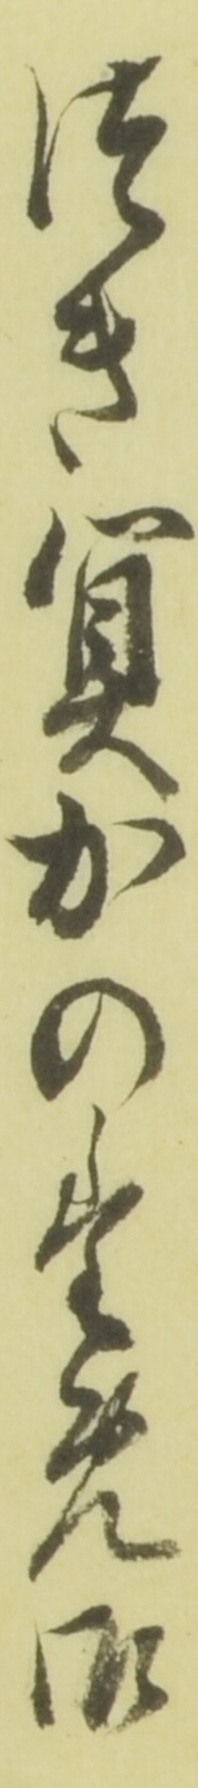つき冥加のため御
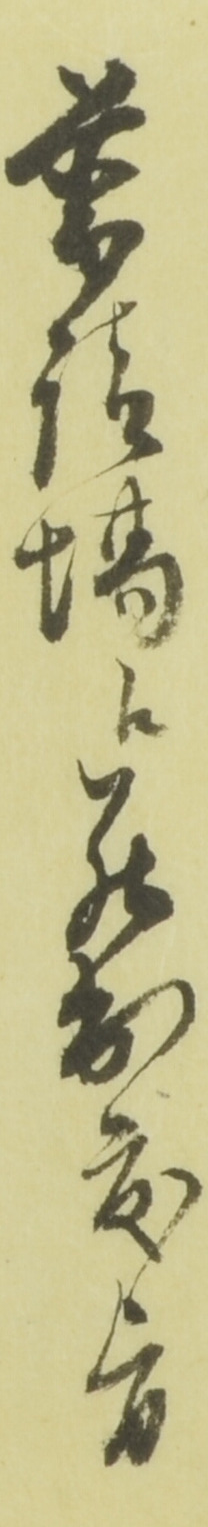普請場江罷出度旨
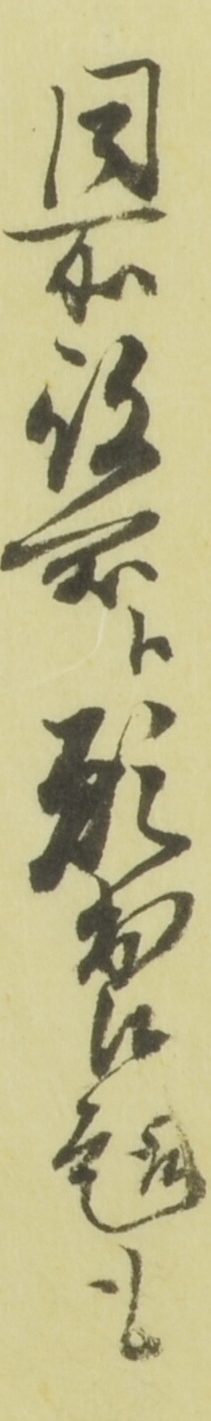同所役所江願出候趣も
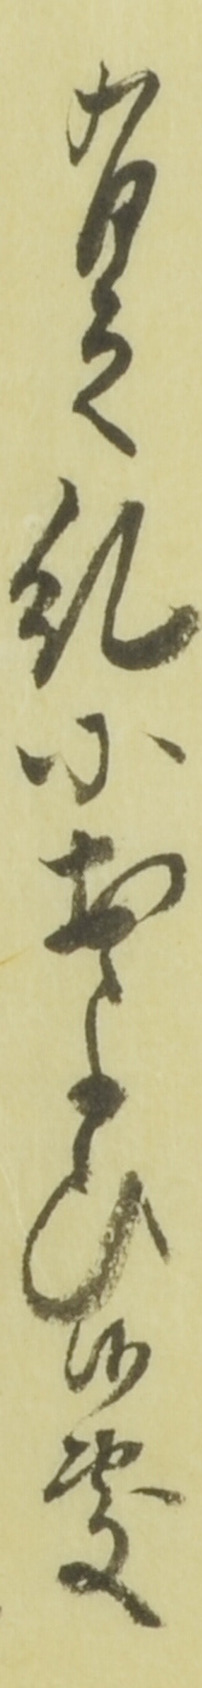有之糺におよひ候処
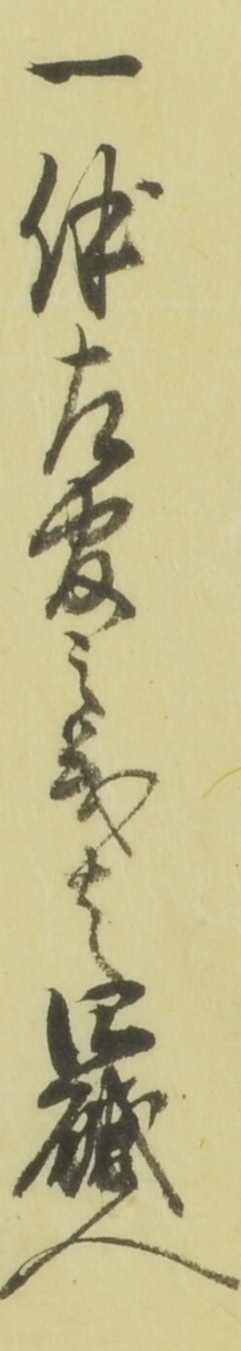一体左官之義は四職人
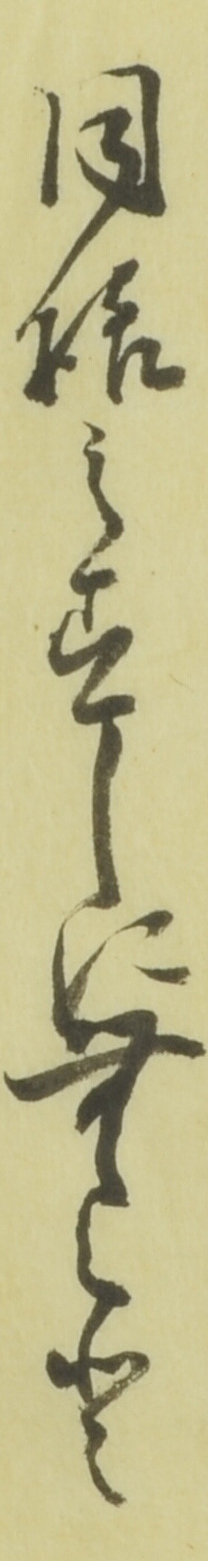同様之すしに無之と
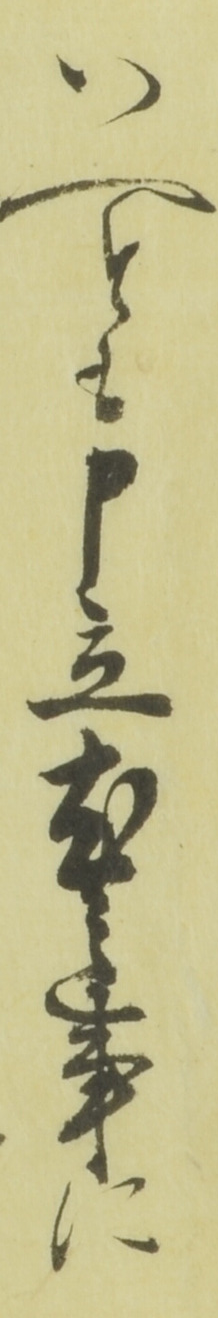いへとも申立尤之事に
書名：御触書御書附控
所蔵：伊那市立高遠町図書館・合同会社AMANE
